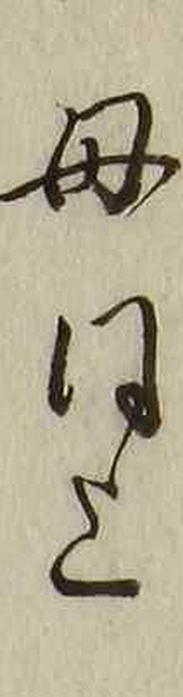母同上
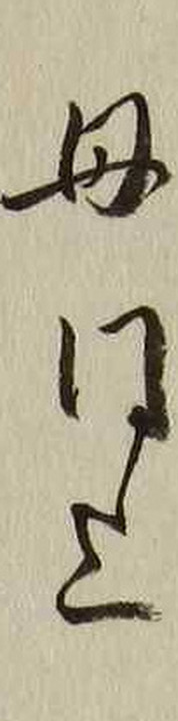母同上
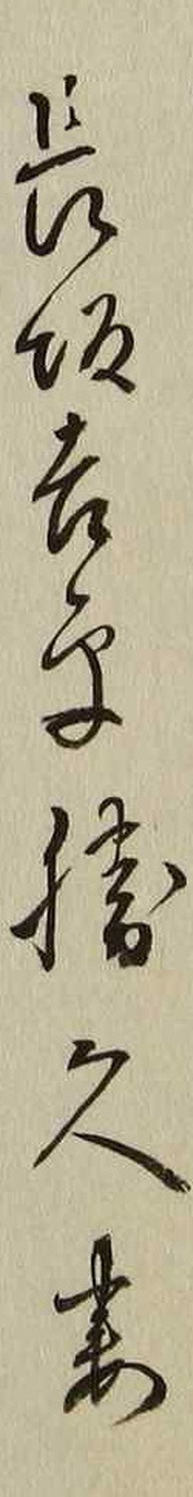女長坂吉平勝久妻
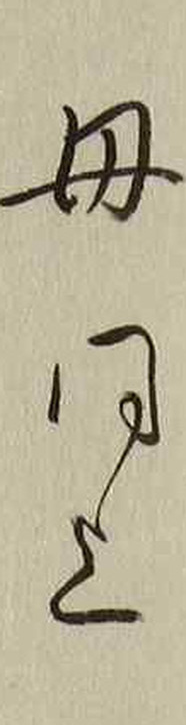母同上
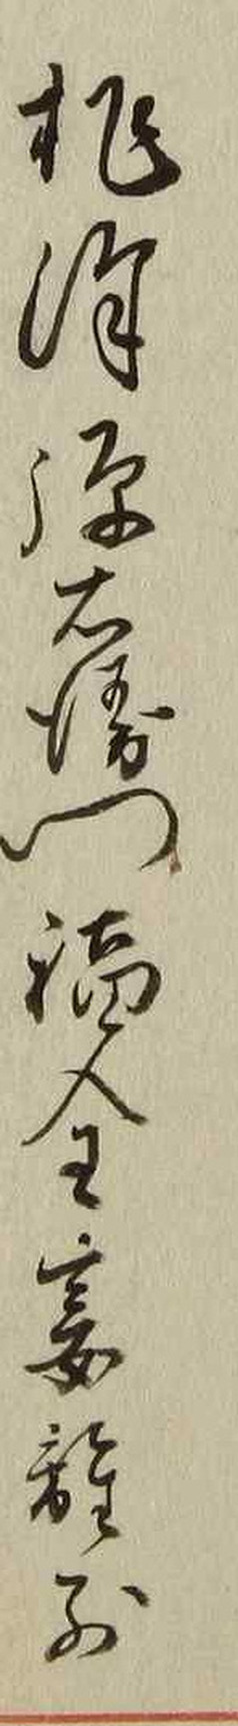桃沢源右衛門福全妻離別
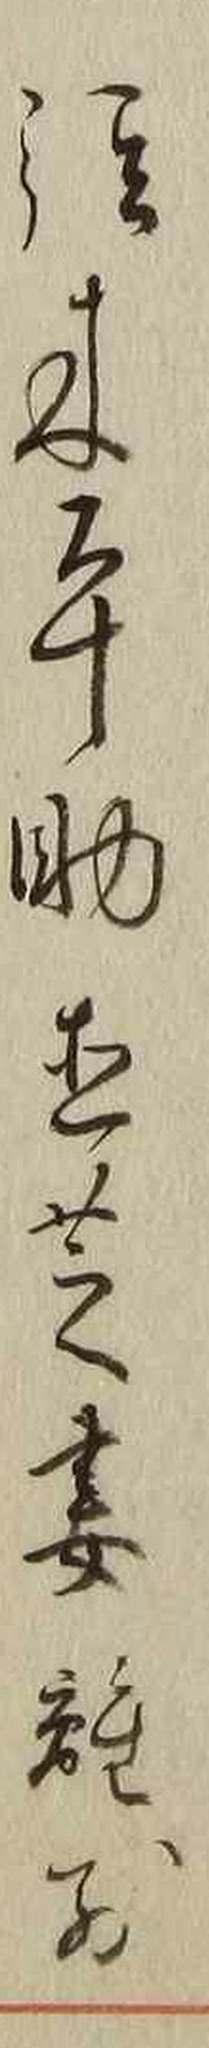女木平助直芝妻離別
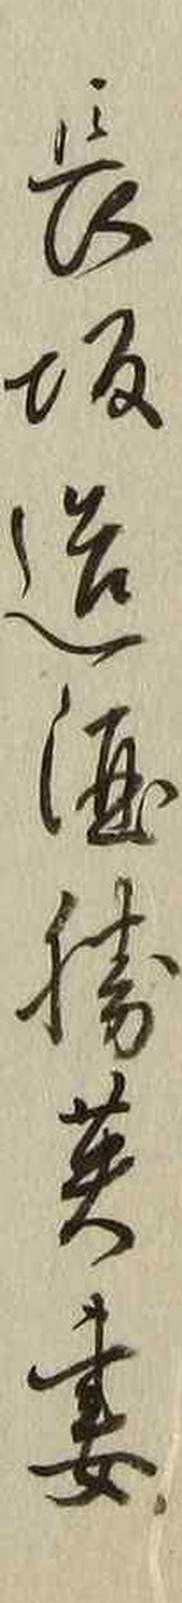長坂造酒勝英妻
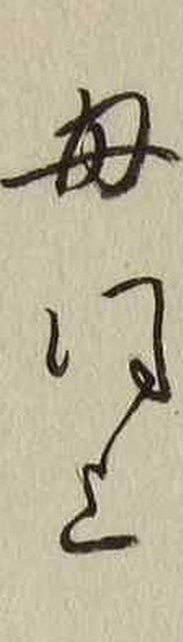母同上

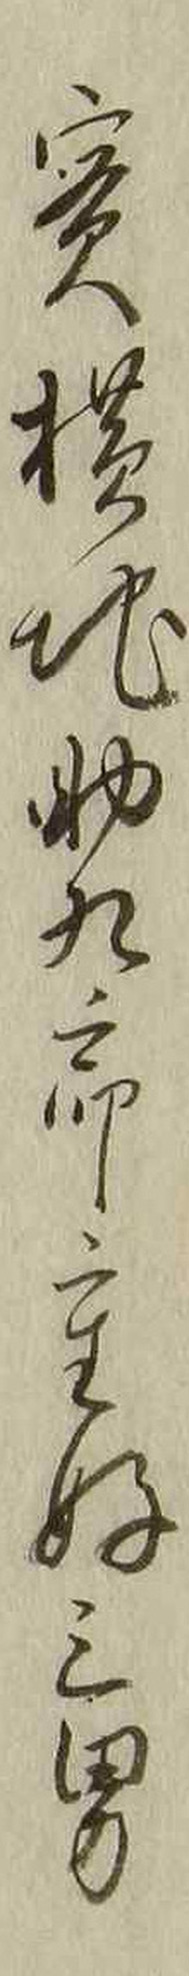実横地助九郎重好三男
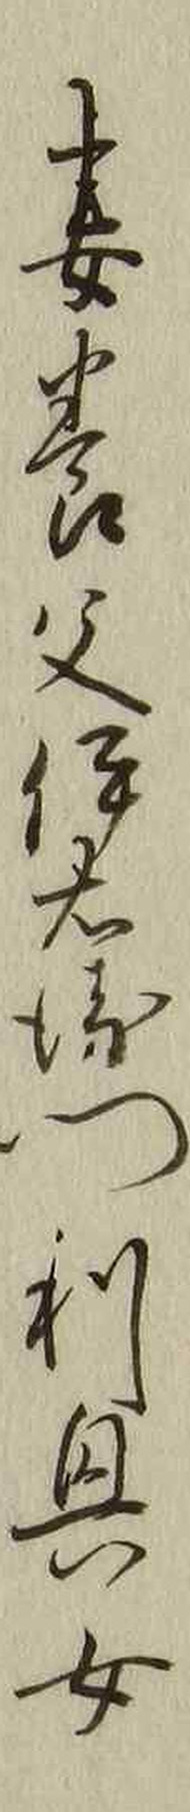妻養父伊右衛門利興女
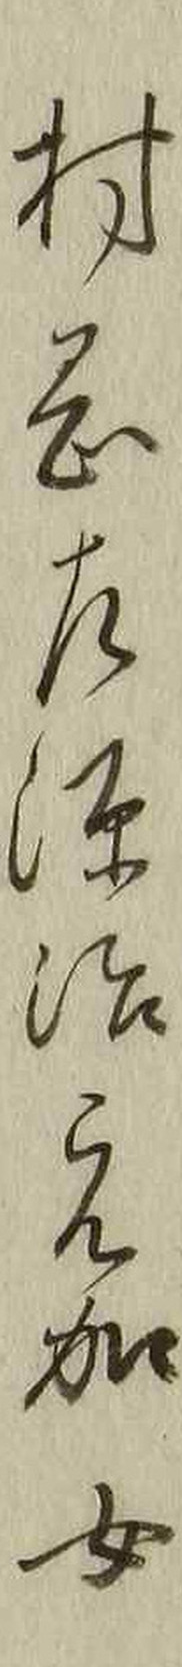村岡左源治元加女
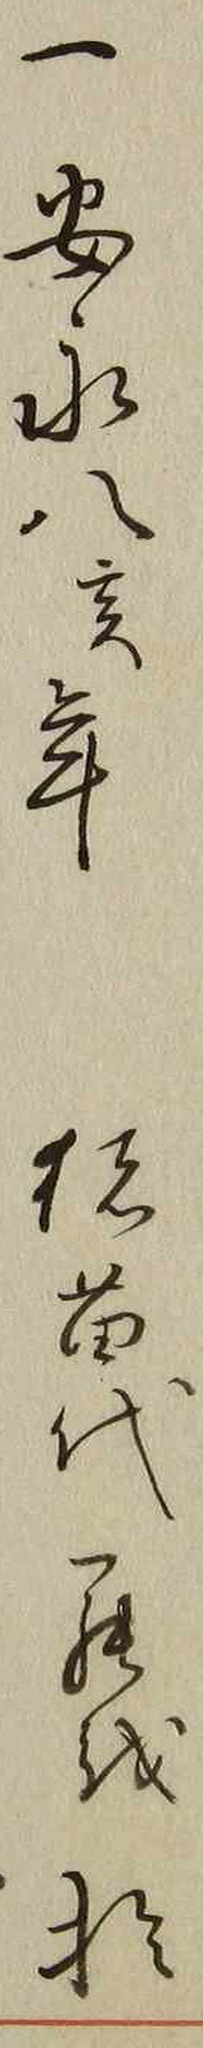一安永八亥年猪苗代罷越於
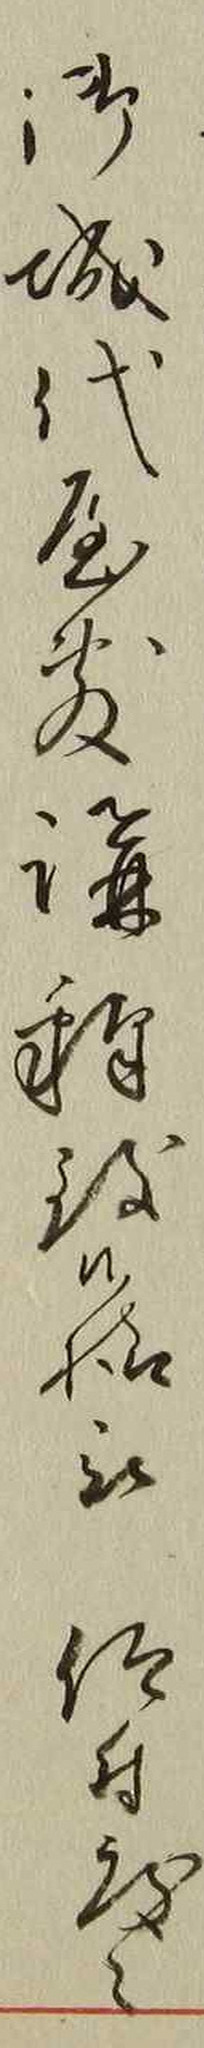御城代屋敷講釈致候様被仰付度々
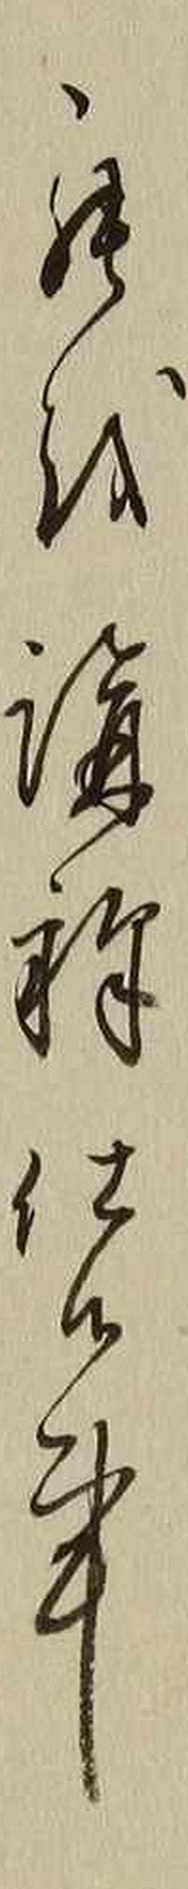罷越講釈仕候事
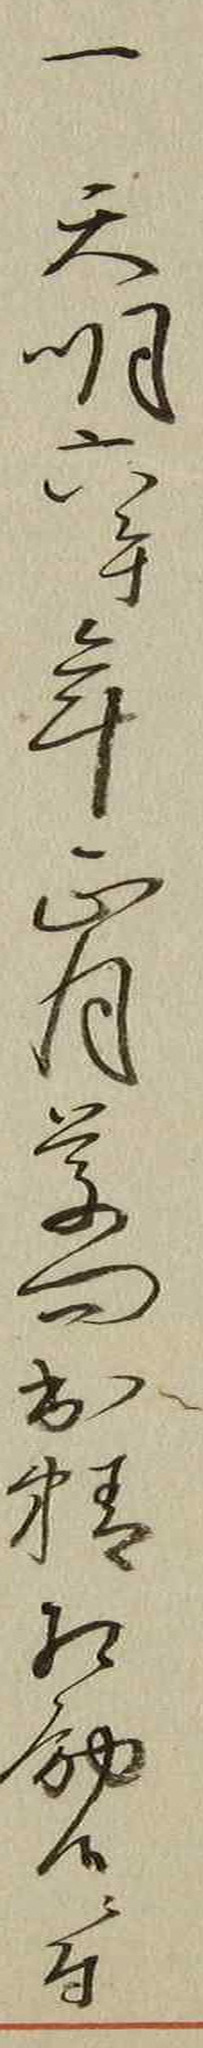一天明六午年正月学問出精相励候に付
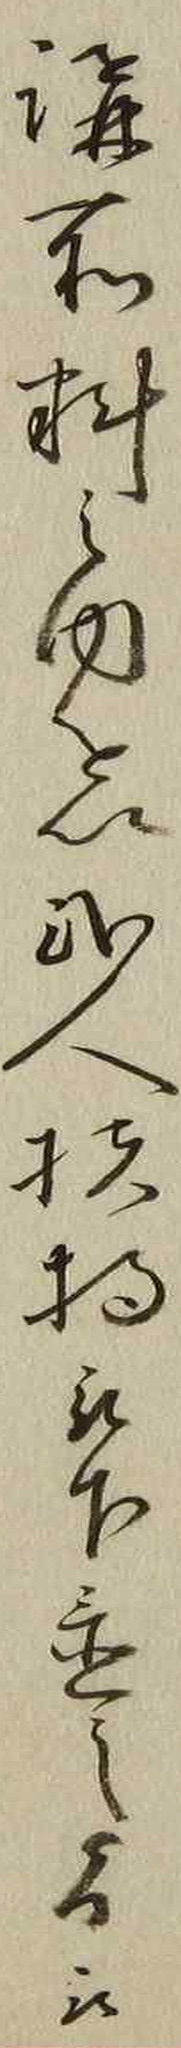講所料之内を以弐人扶持被下置之旨被
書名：諸士系譜　巻之3　い之部3
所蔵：会津若松市立会津図書館
